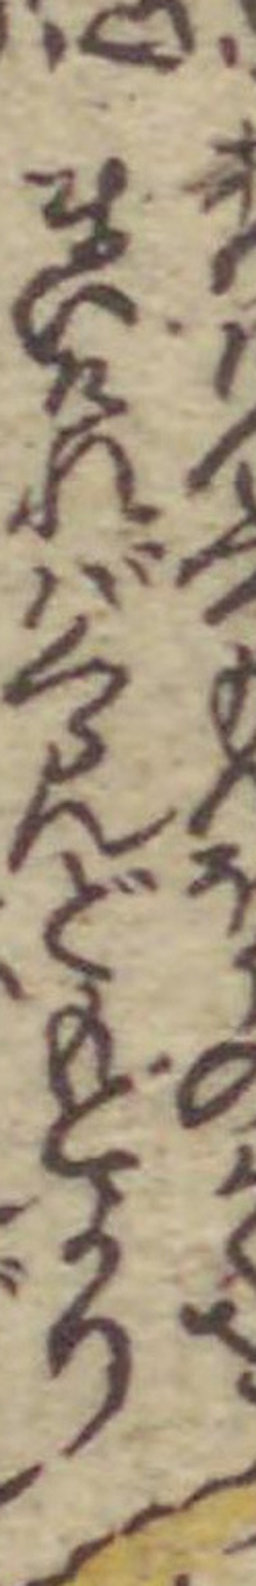まいければくらんどもとより
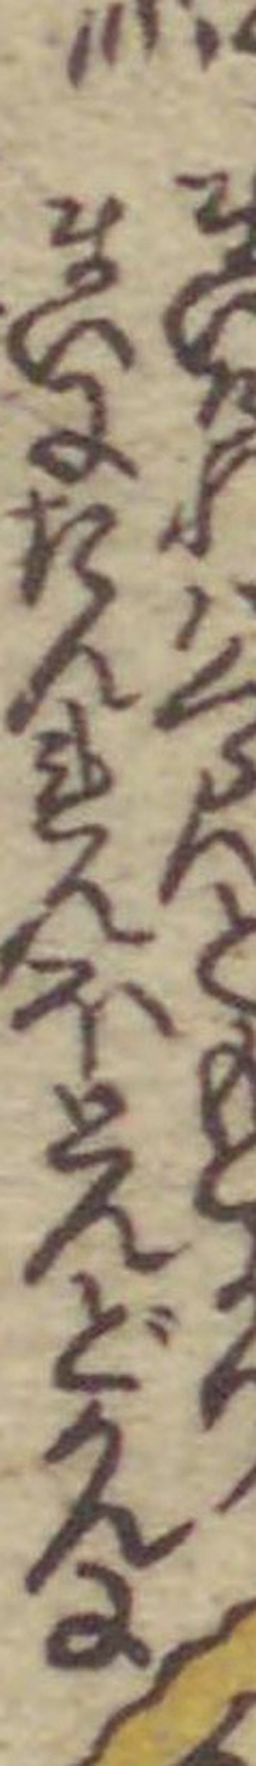まいにたんれんほとんどかんに
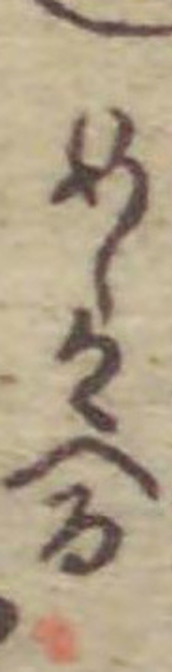めしかゝへる
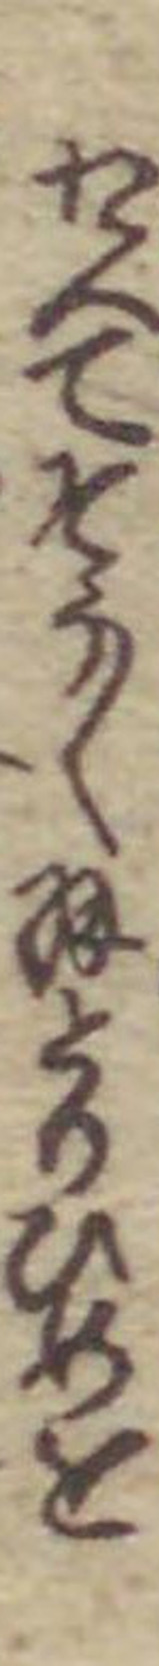たへてそう〳〵羽とりひめを
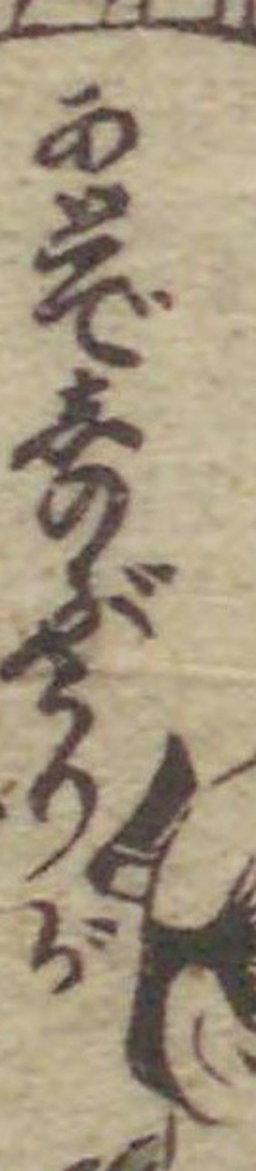あとでしのぶうりが
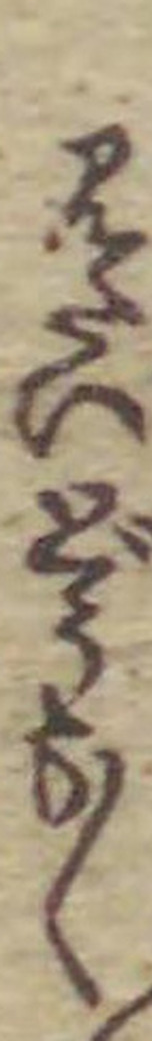見たいどうも〳〵

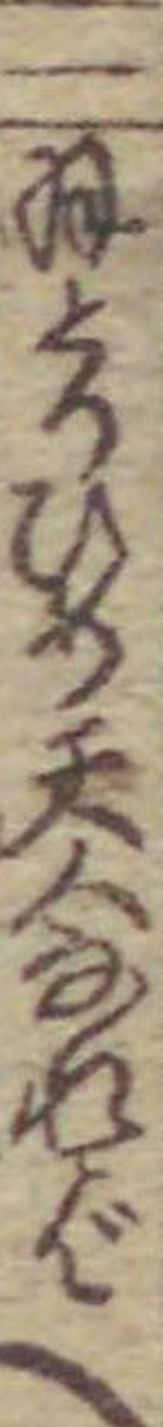羽とりひめ天人なれば
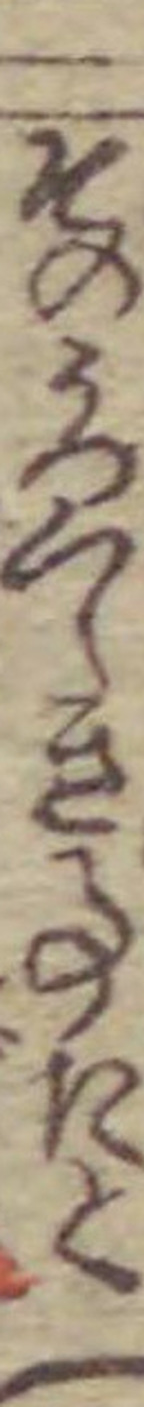そのうつくしき事たと
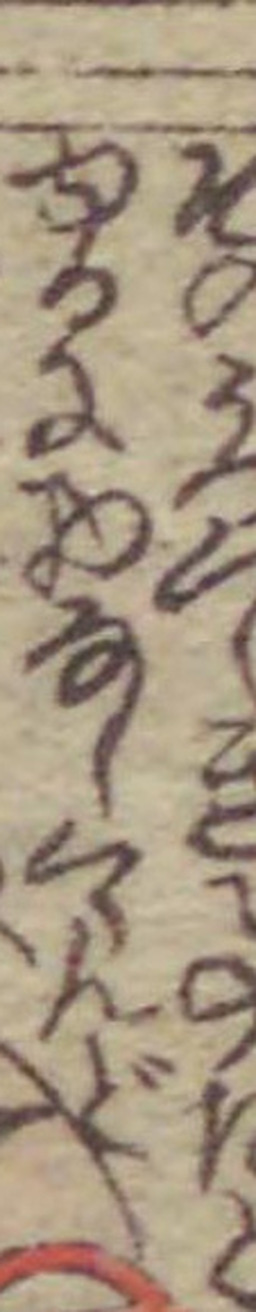ゆるに物なしくらんど
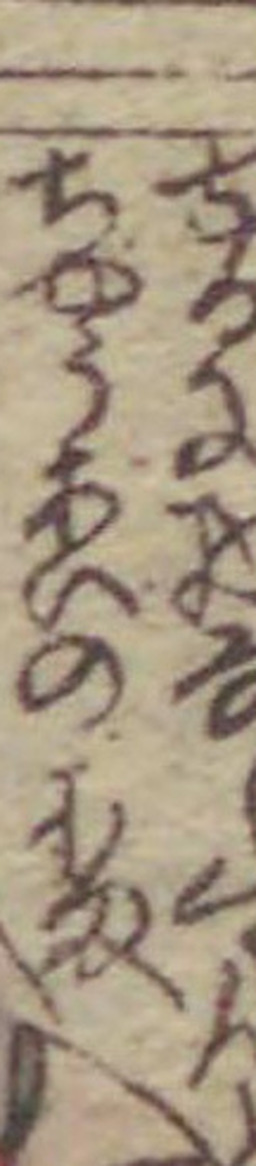ちやうあいのあま
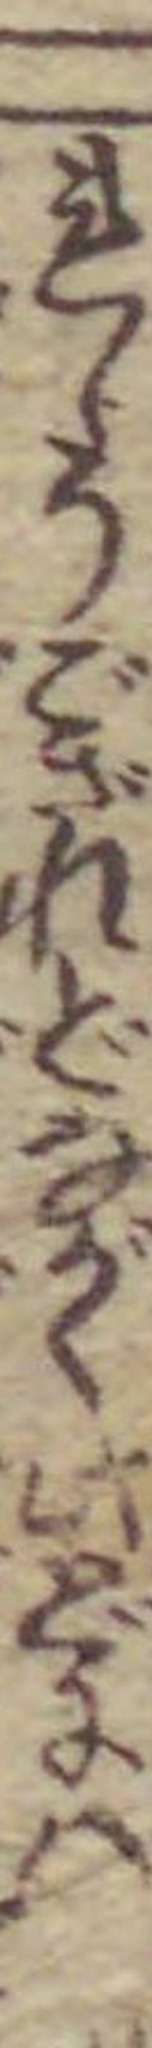れしうござれどながく此どには
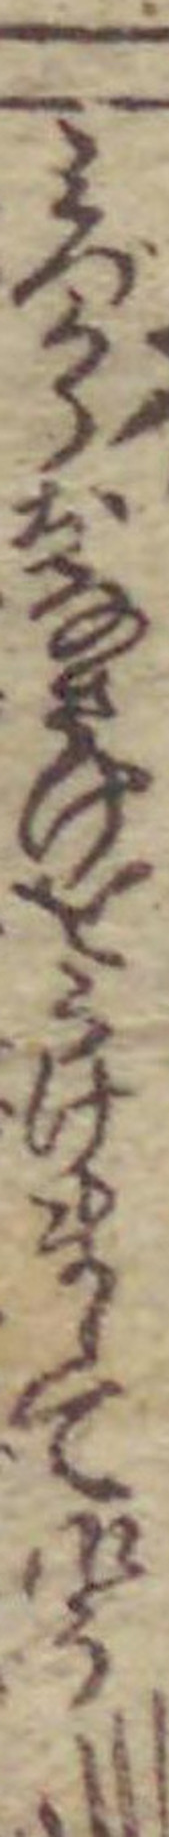みづからおなさけをうけまして御う
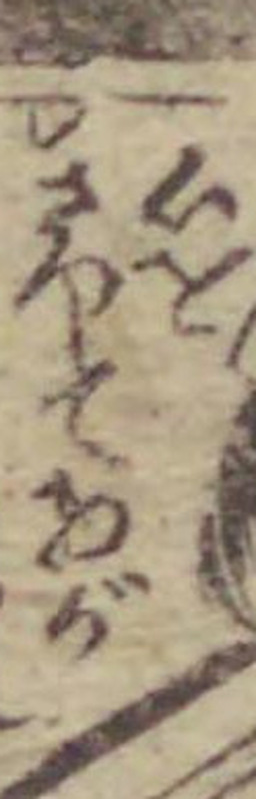さつして物が
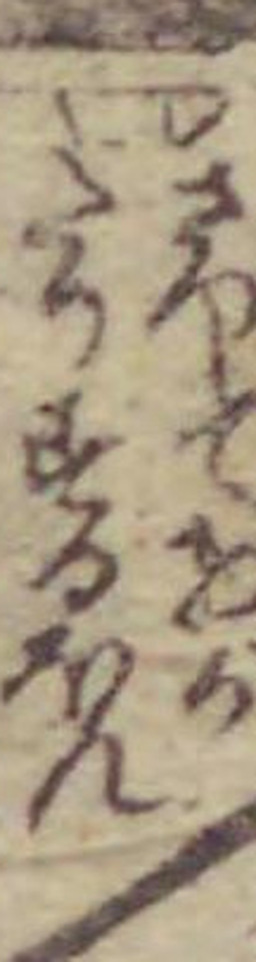たりするほん
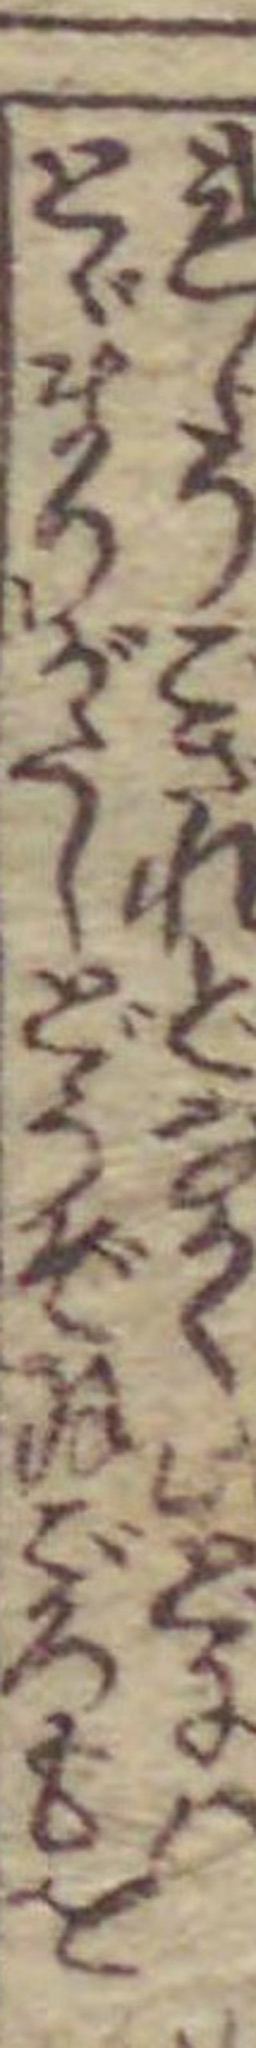とゞまりがたしどうぞ羽ごろもを
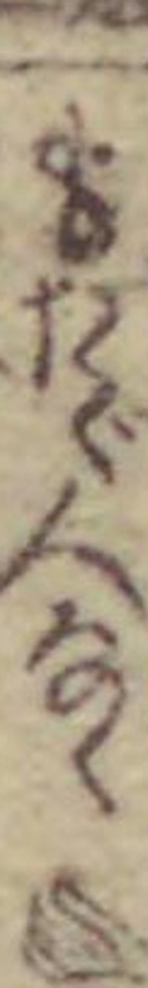もたゞ人なく
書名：娜二代鉢木 5巻
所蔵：国立国会図書館 National Diet Library, JAPAN
